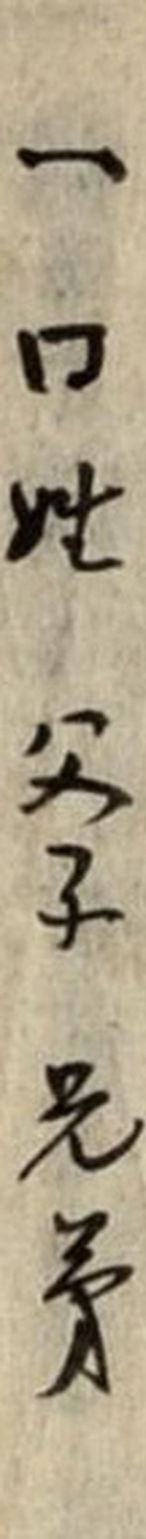一同姓父子兄弟
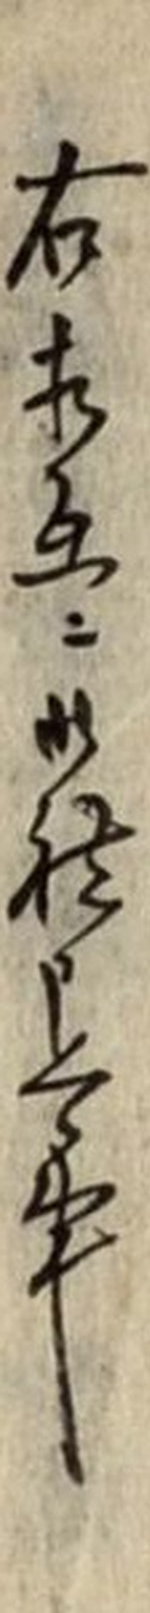右相互ニ御礼申上候事
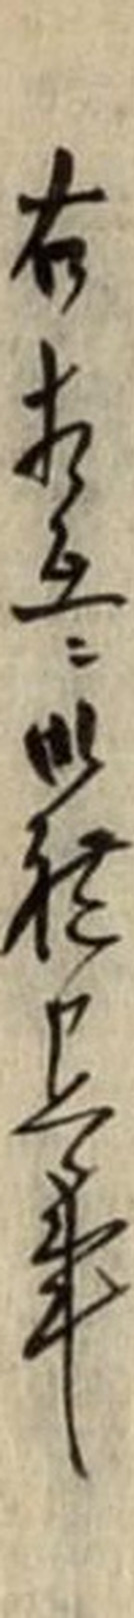右相互ニ御礼申上候事
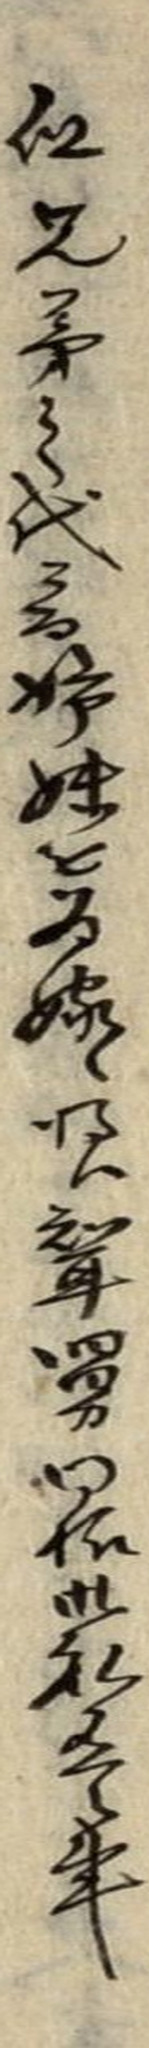但兄弟之代に而姉妹を為嫁候得ハ聟舅同様御礼有之事
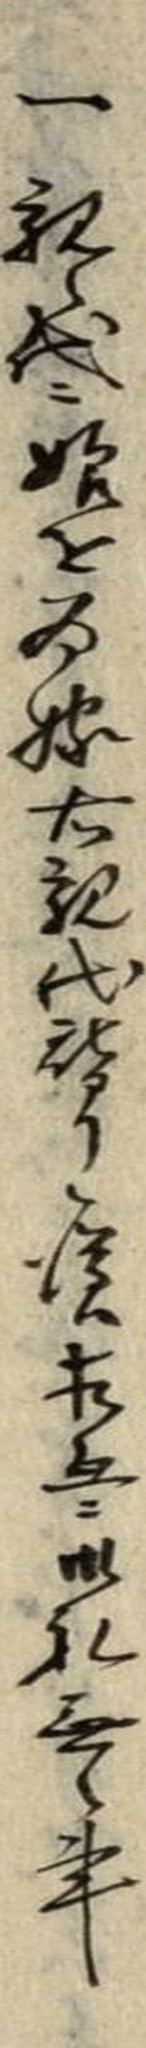一親之代に娘を為嫁右親代替り候得ハ相互に御礼無之事
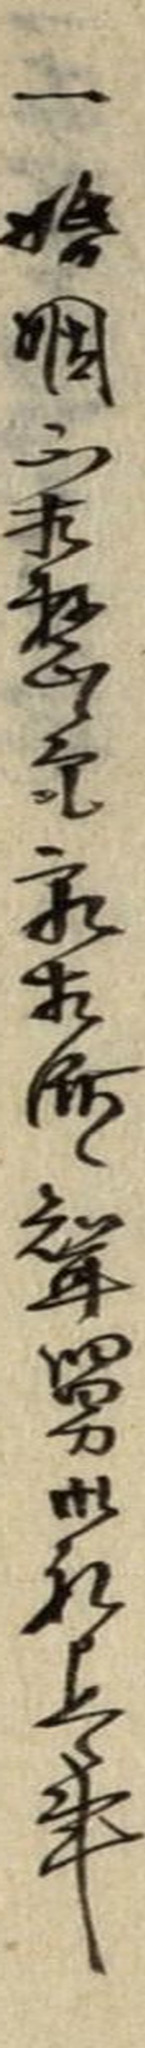一婚姻不相整候而も願相済候聟舅御礼申上候事
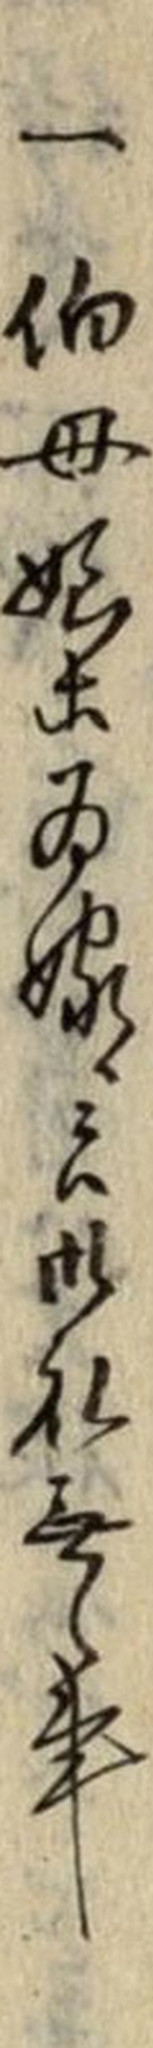一伯母姪等為嫁候には御礼無之事
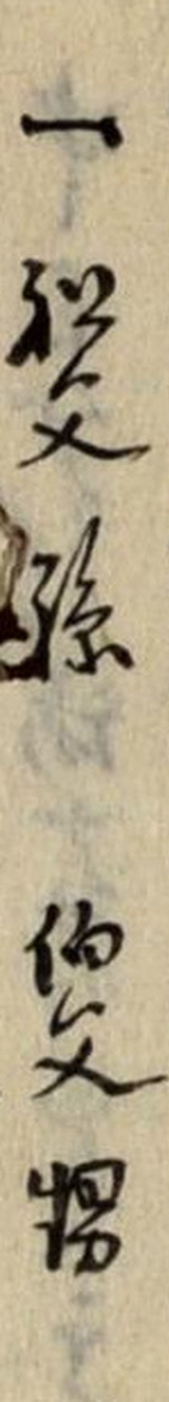一祖父孫叔父甥
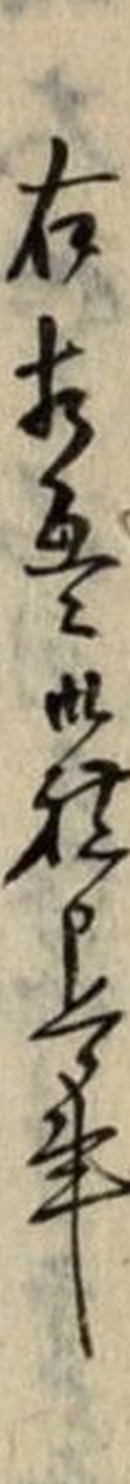右相互ニ御礼申上候事
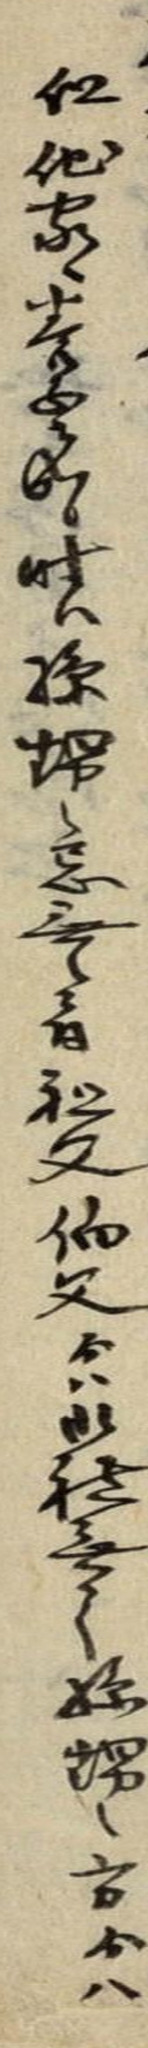但他家へ養子に成候時ハ孫甥之忌無之に付祖父伯父ゟは御礼無之孫甥之方ゟは
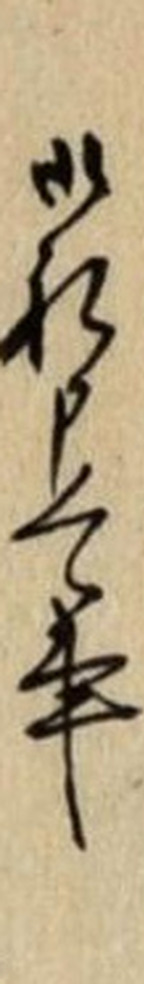御礼申上候事
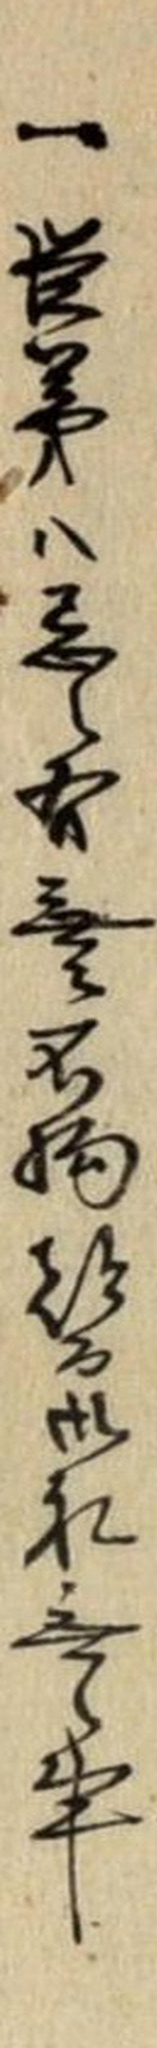一従弟は忌之有無に不拘都而御礼無之事
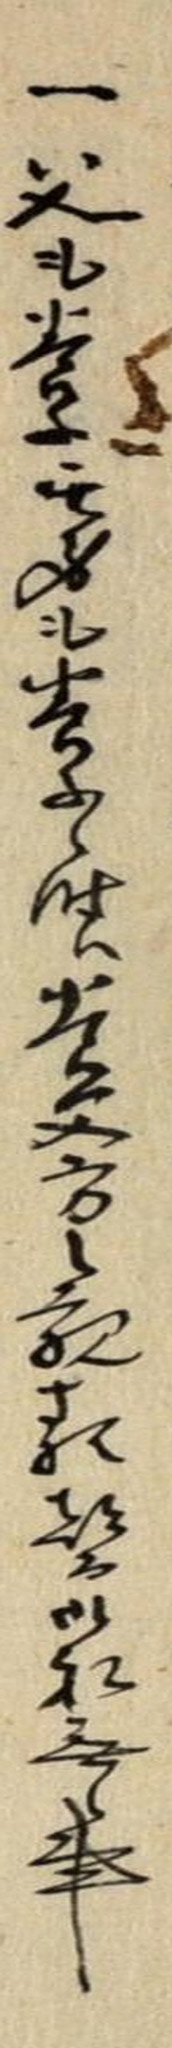一父も養子其身も養子之時は養父方之親類都而御礼無之事
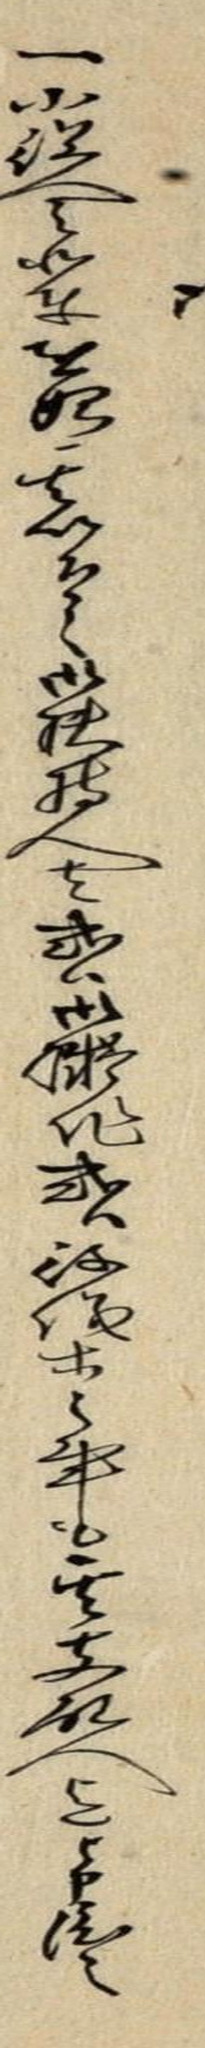一小役人之輩を始其以下之御扶持人は或は御擬作或は役儀等之事も其支配人迄被申渡之
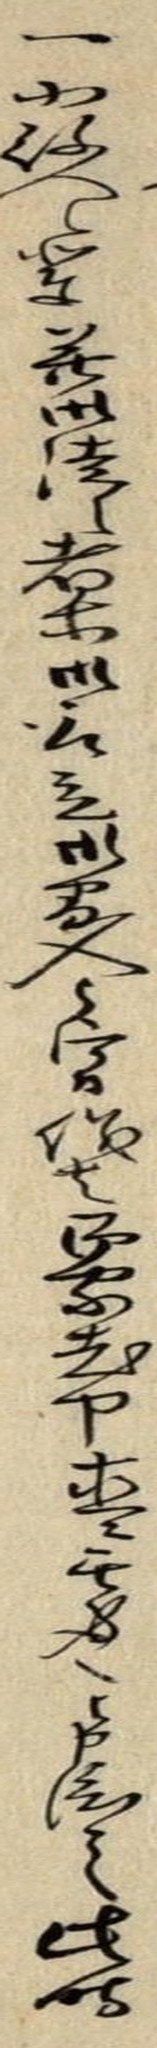一小役人之輩并御徒之者等御取立御番人被仰付儀は御家老中直ニ其身へ被申渡之此時
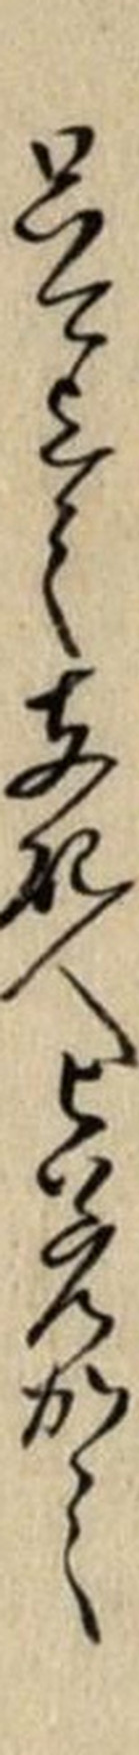只今迄之支配人被差加之
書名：御用并被仰出之部
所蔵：福井県文書館 Fukui Prefectural Archives
